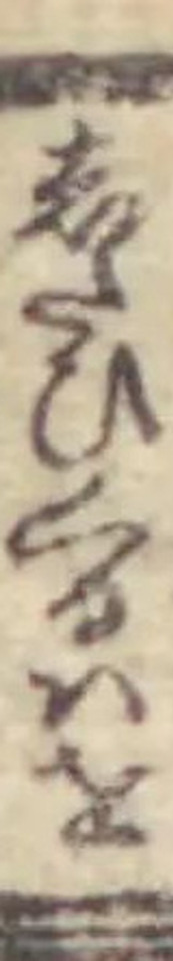したひくるはを
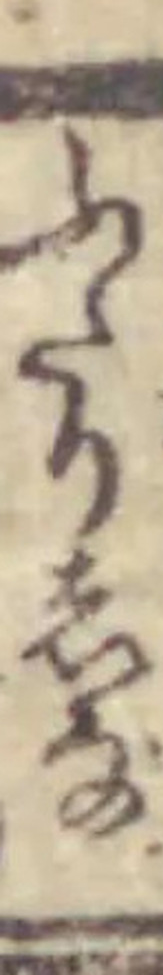ふたりしな
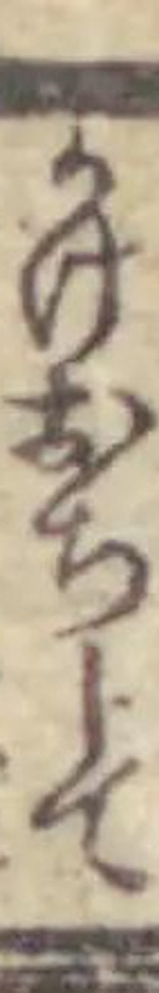かけおちして
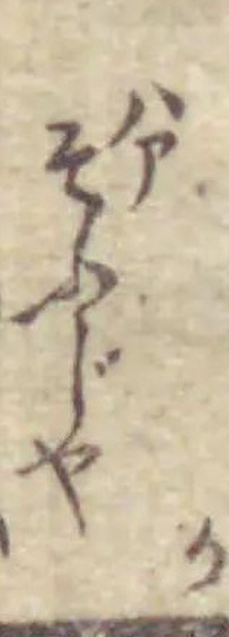そふじや
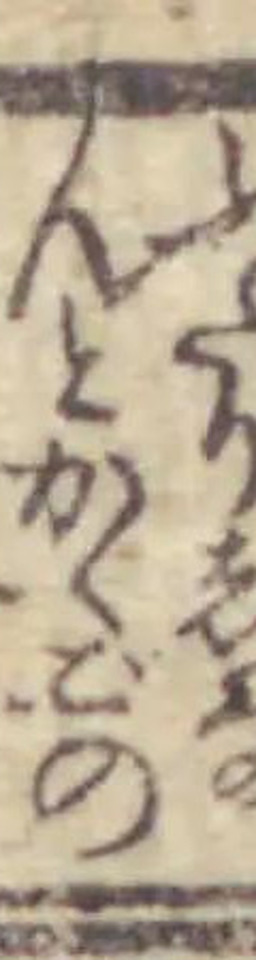んとかくごの
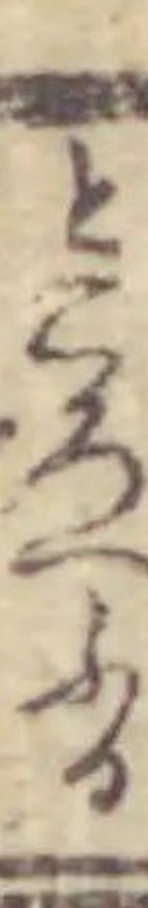ところへふる
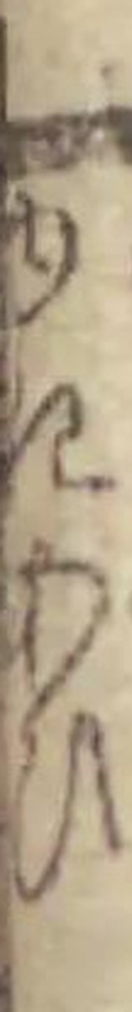ゆきあひ
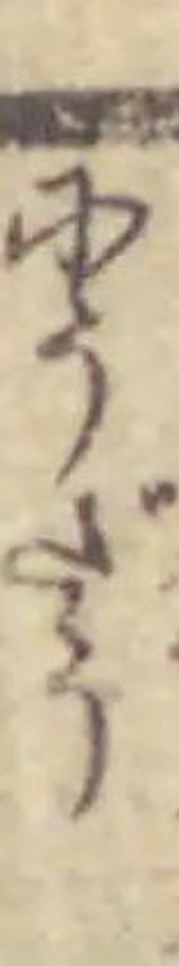にうだう
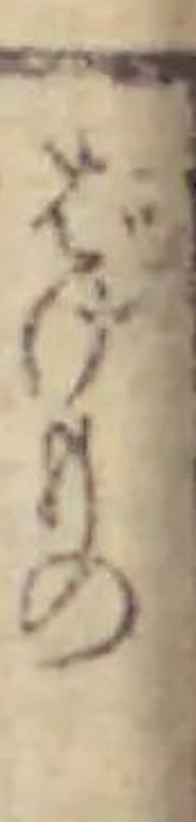ばけもの
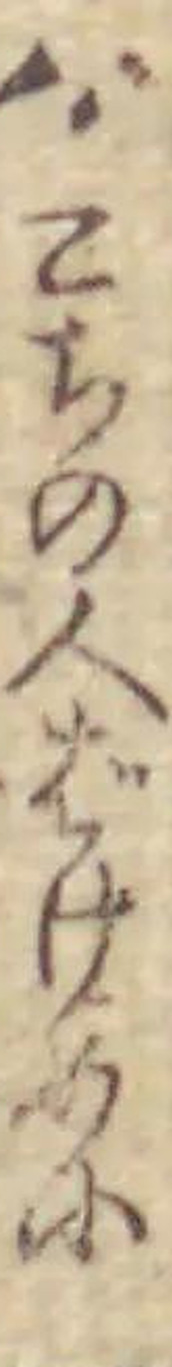こちの人ばけめに
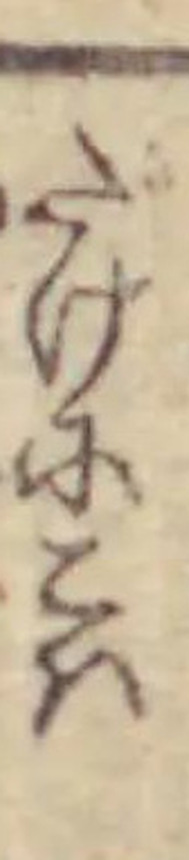だけにこは
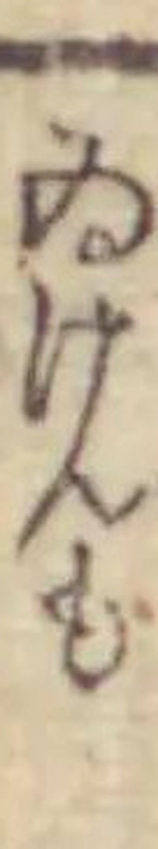ゐけんも
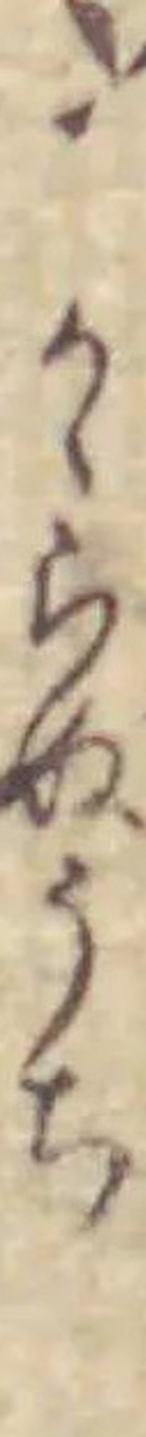かゝらぬうち
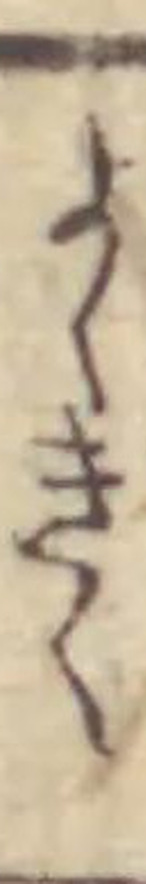よくきく
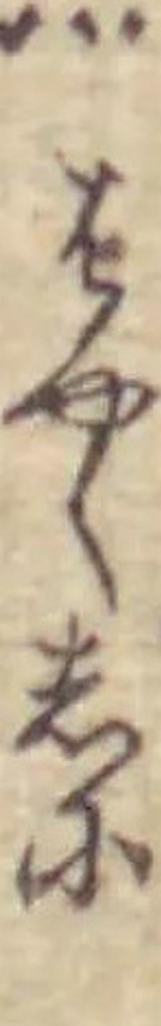はやくしに
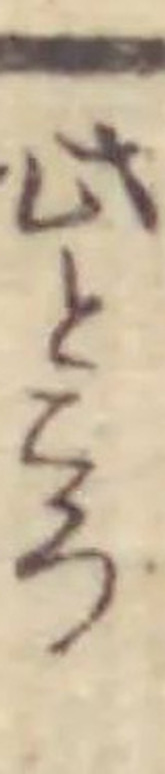此ところ
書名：大昔化物双紙 2巻
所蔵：国立国会図書館 National Diet Library, JAPAN
